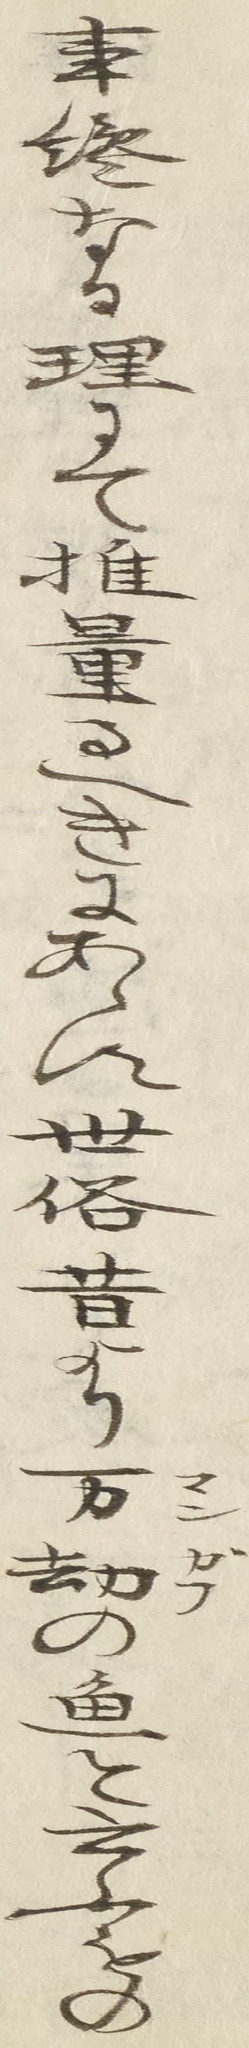事纔なる理にて推量るへきにあらす世俗昔より万劫の魚と云ふもの
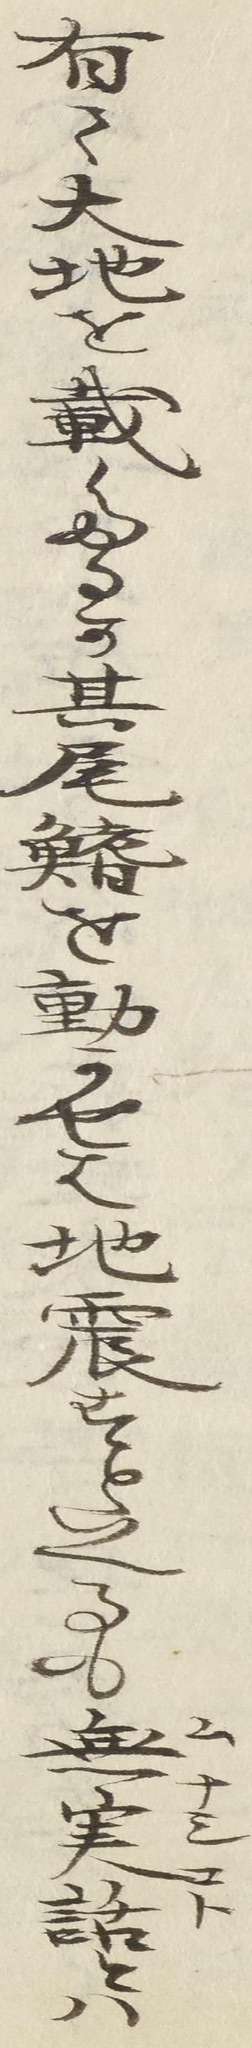有て大地を載たるの其尾鰭を動かせは地震すといへるも無実話とは
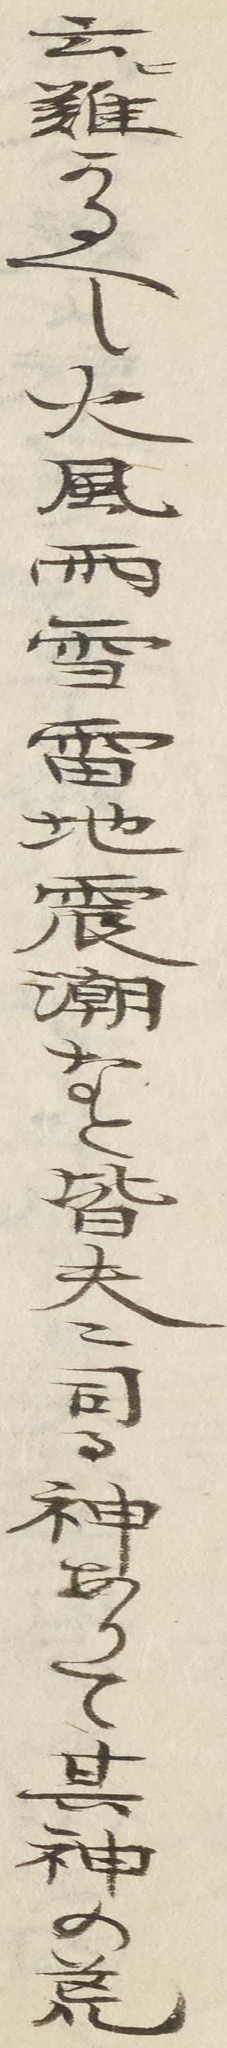云ひ難かるへし火風雨雪雷地震潮なと皆夫々司る神ありて其神の荒
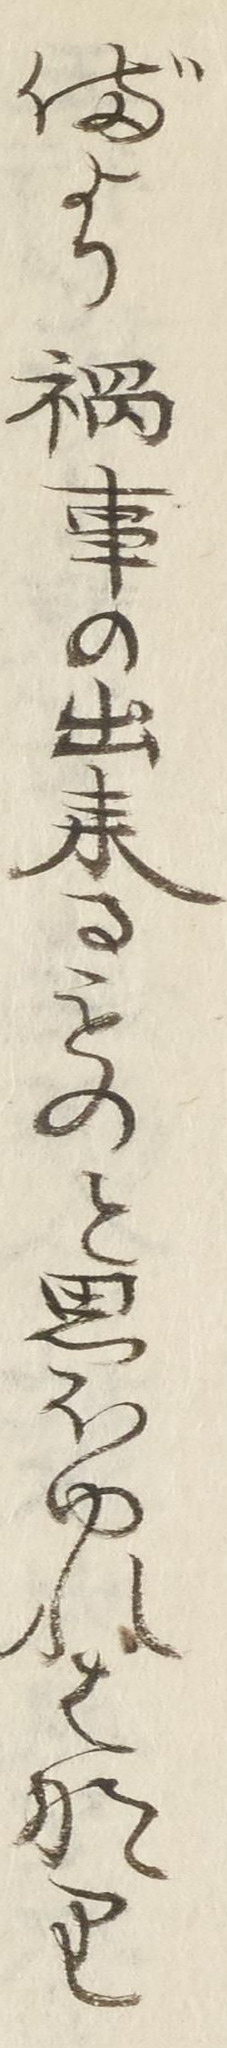ばより禍事の出来るものと思ほゆれはなり
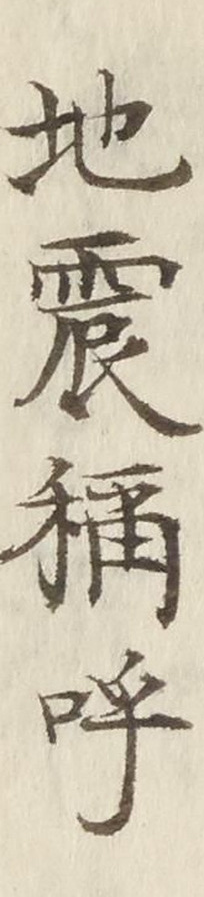地震称呼
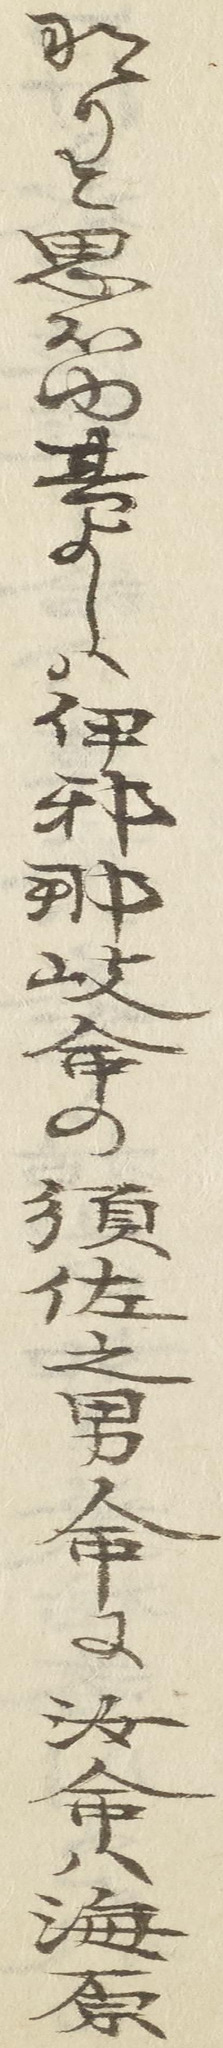なりと思ほゆ其よしは伊邪那岐命の須佐之男命に汝命は海原
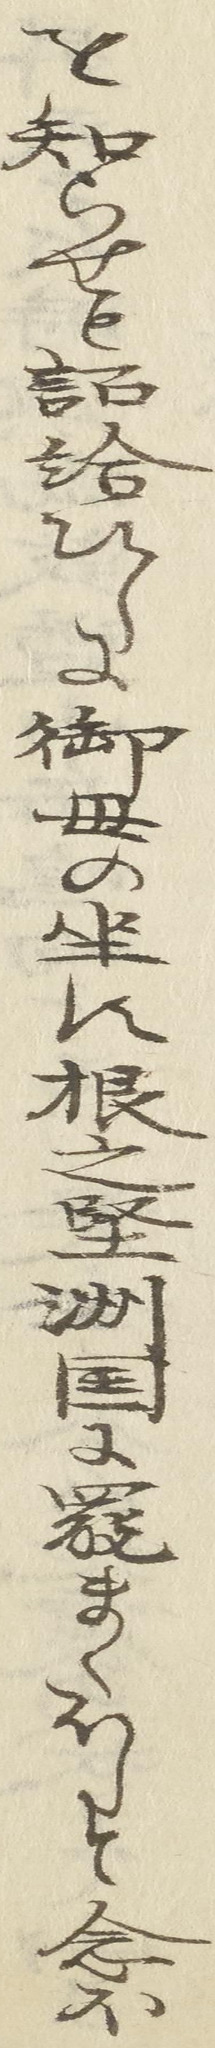を知らせと詔給ひしに御母の坐す根之堅洲国に罷ましほに念不
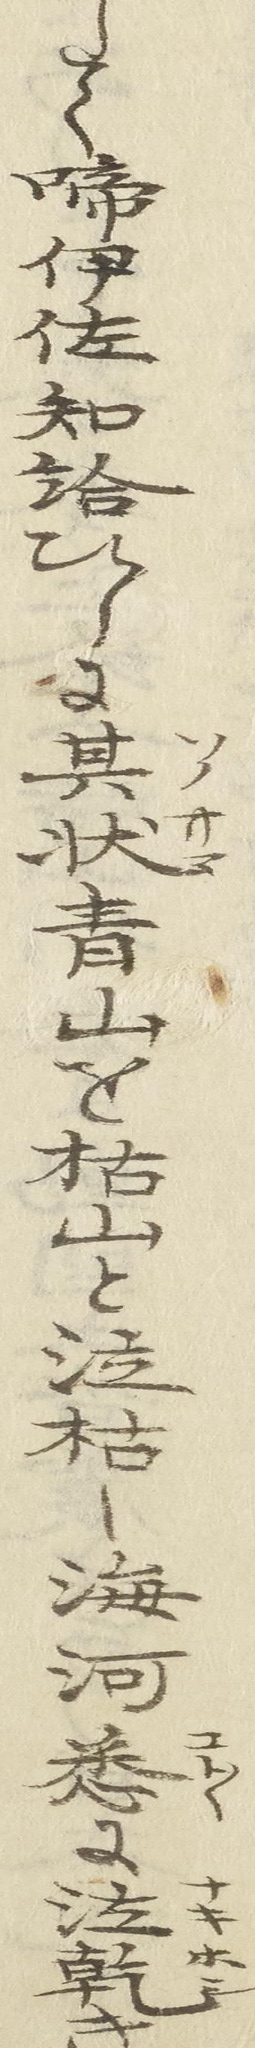して啼伊佐知給ひしに其状青山を枯山と泣枯し海河悉に泣乾き

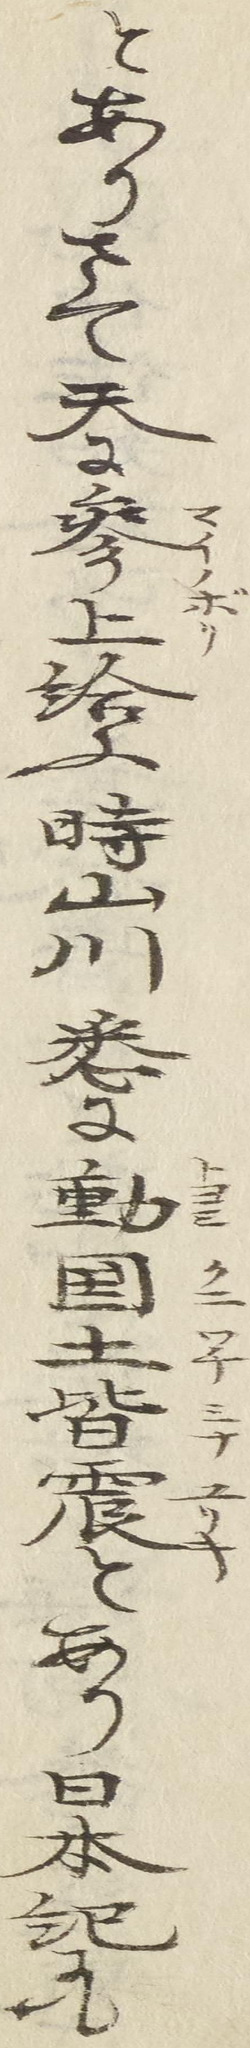とありとて天に参上給ふ時山川悉に動国土皆震と有り日本記にも
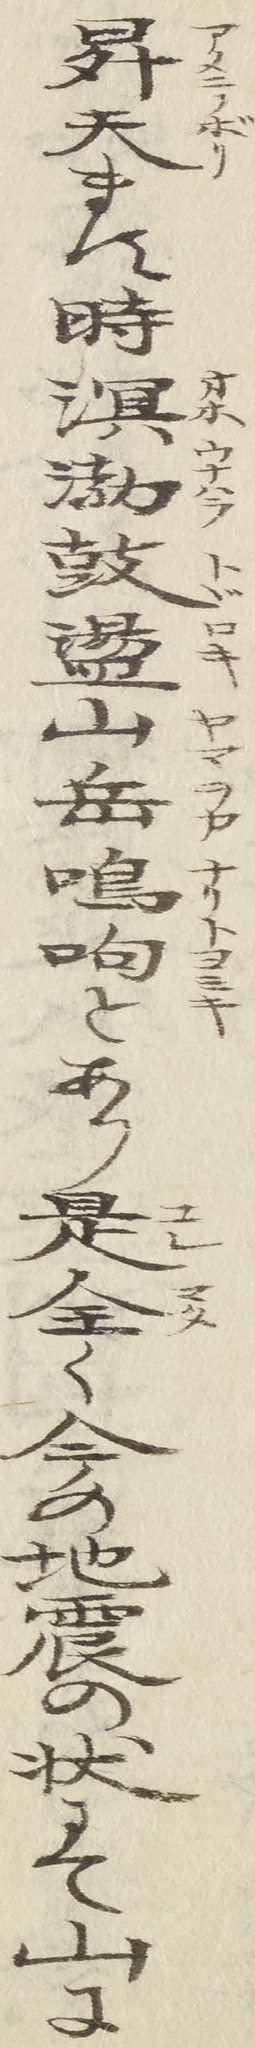昇天ます時溟動皷盪山岳鳴呴とあり是全く今の地震の状にて山に
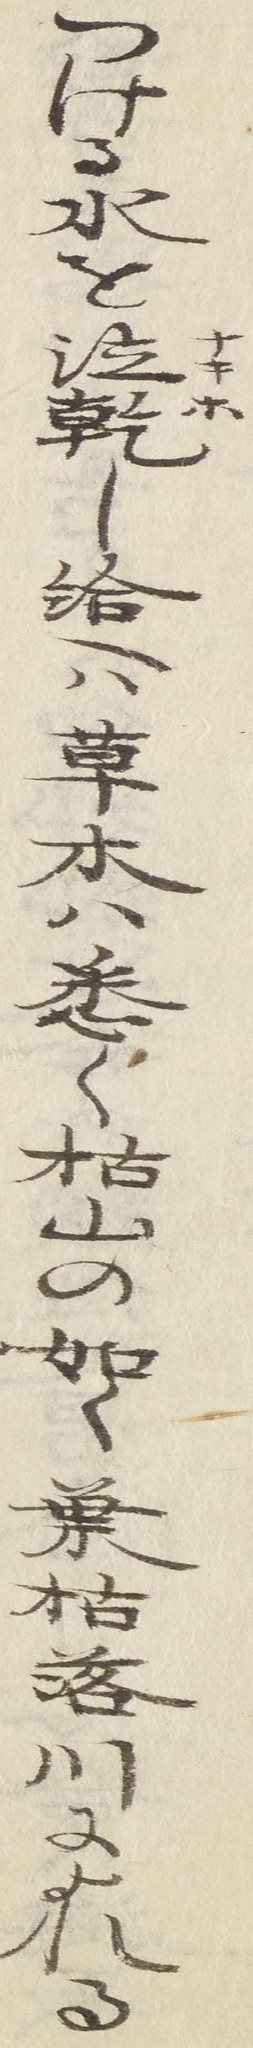つける水を泣乾し給へは草木は悉く枯山の如く葉枯落川によれる
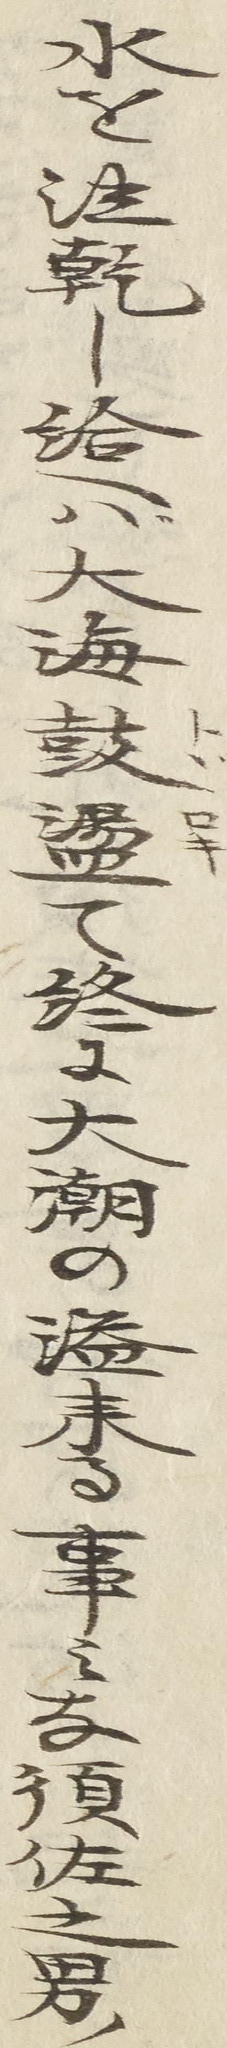水を注乾し給へは大海皷盪て終に大潮の溢来る事みな須佐之男の
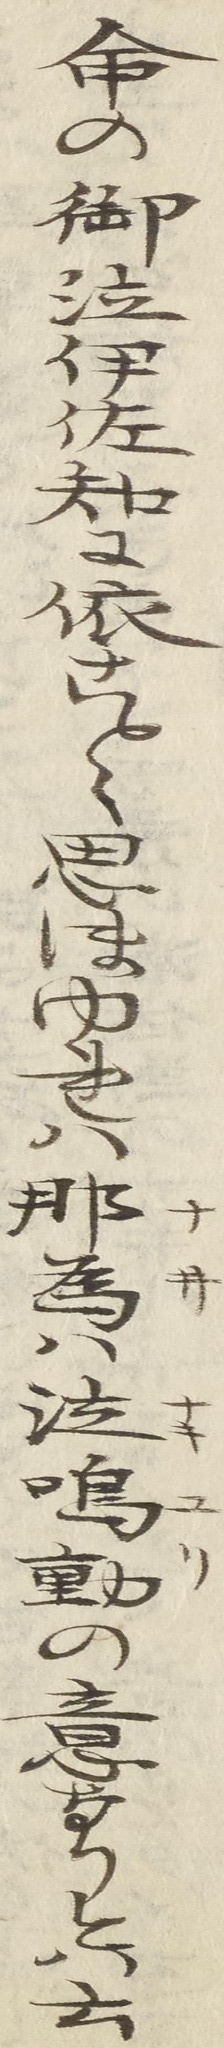命の御泣伊佐知に依こと思ほゆれは那為は泣鳴動の意なりとは云
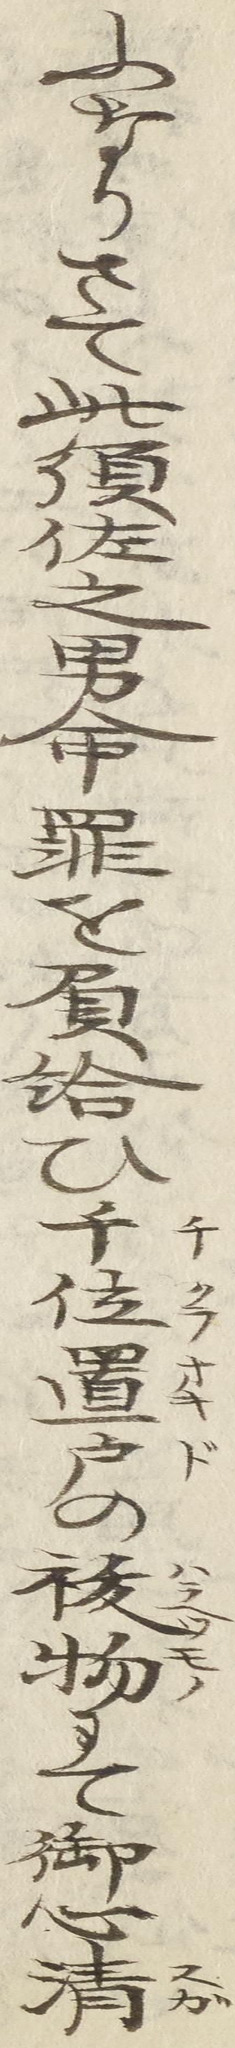ふなりさて此須佐之男命罪を負給ひ千位置戸の祓物にて御心清
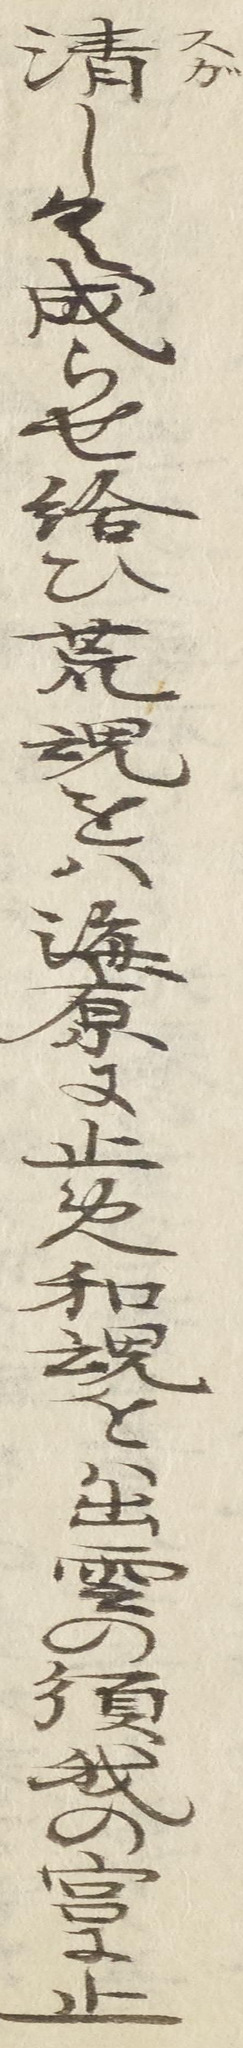清しく成らせ給ひ荒魂をは海原に止め和魂をは出雲の須我の宮に止
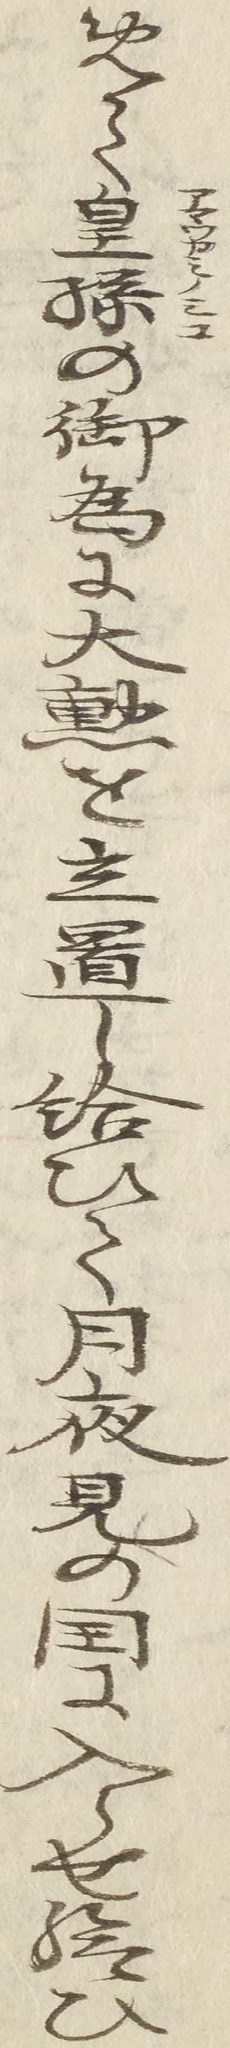めて皇孫の御為に大勲を立置し給ひて月夜見の国に入らせ給ひ
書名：地震記　下
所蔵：東京大学地震研究所図書室 Earthquake Research Institute Library, The University of Tokyo, JAPAN
